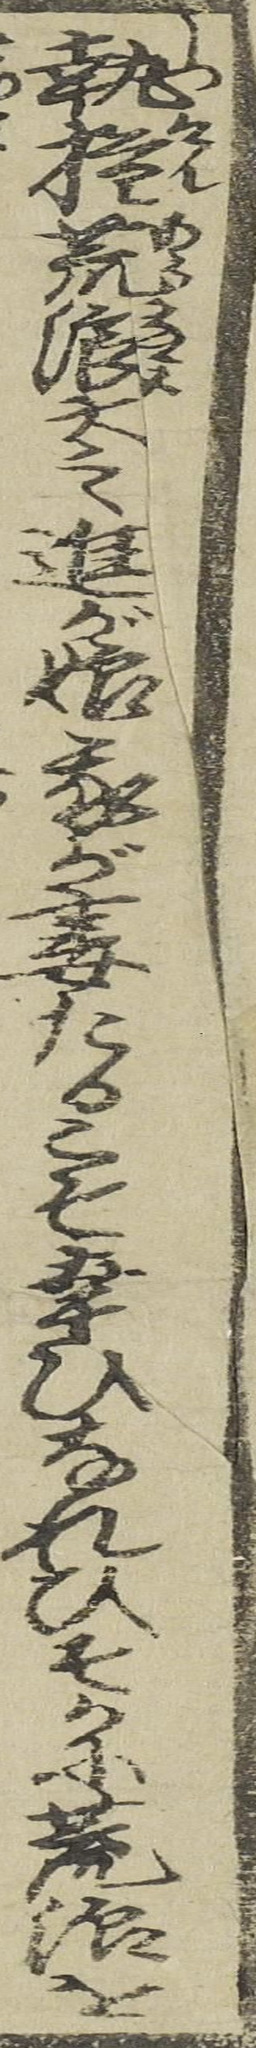執権荒浪大之進が娘我が妻たるこそ幸ひなれひそかに荒浪を
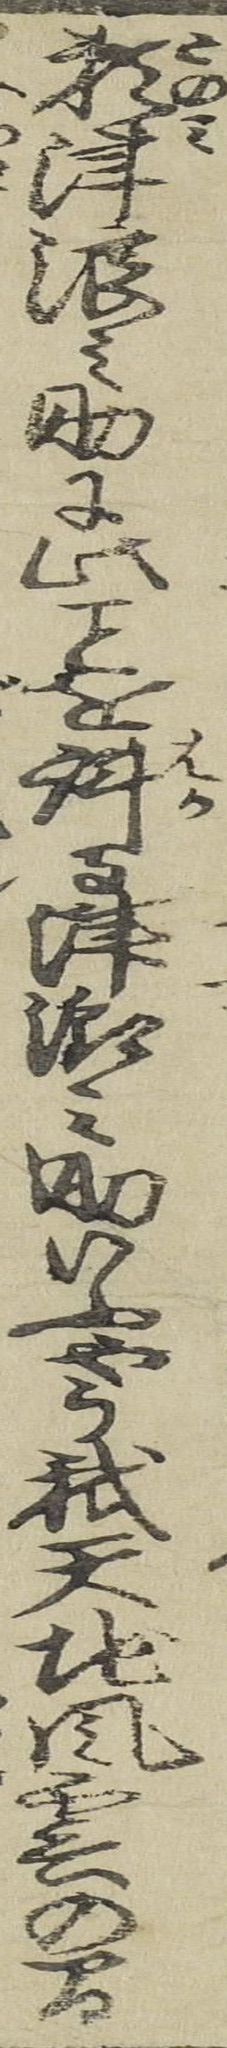頼津浪之助に此ことを計る津浪之助いふやう我天地風雲の間
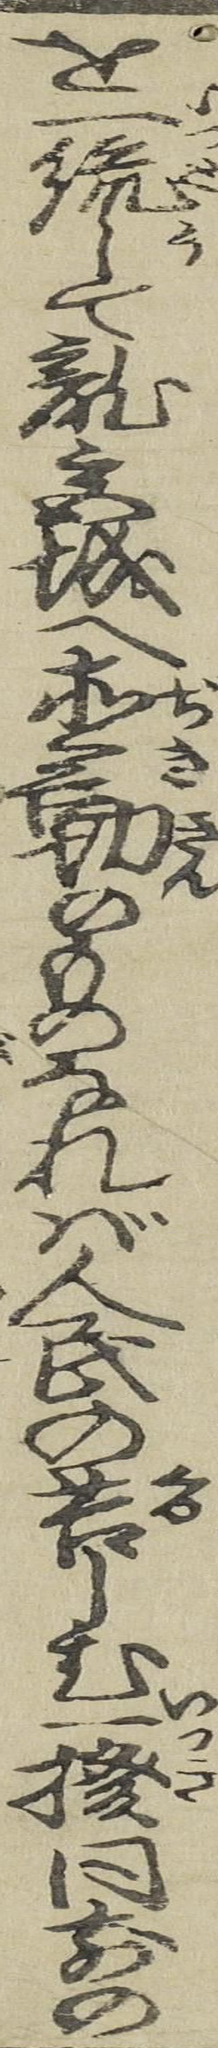を一統して竜宮城へ直勤のものなれば人民の苦しむ一揆同前の
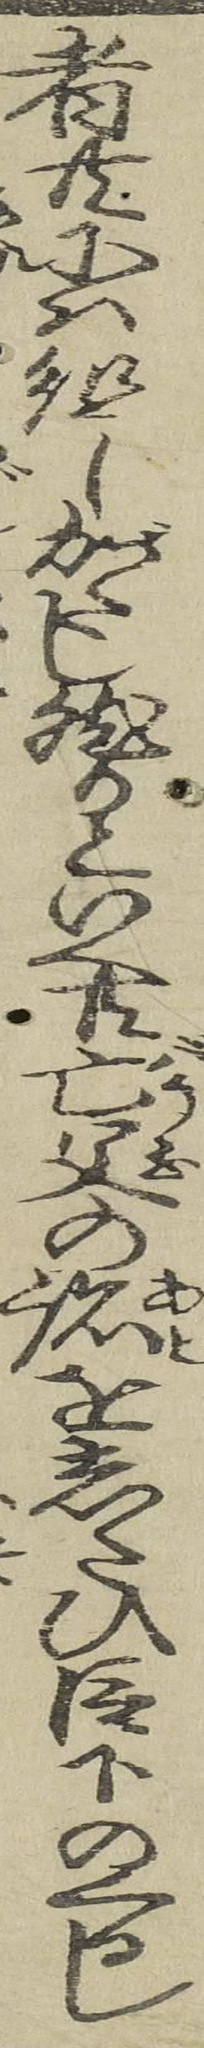者共には組しがたし然りといへ共亡父の跡をしたひ臣下のくるし
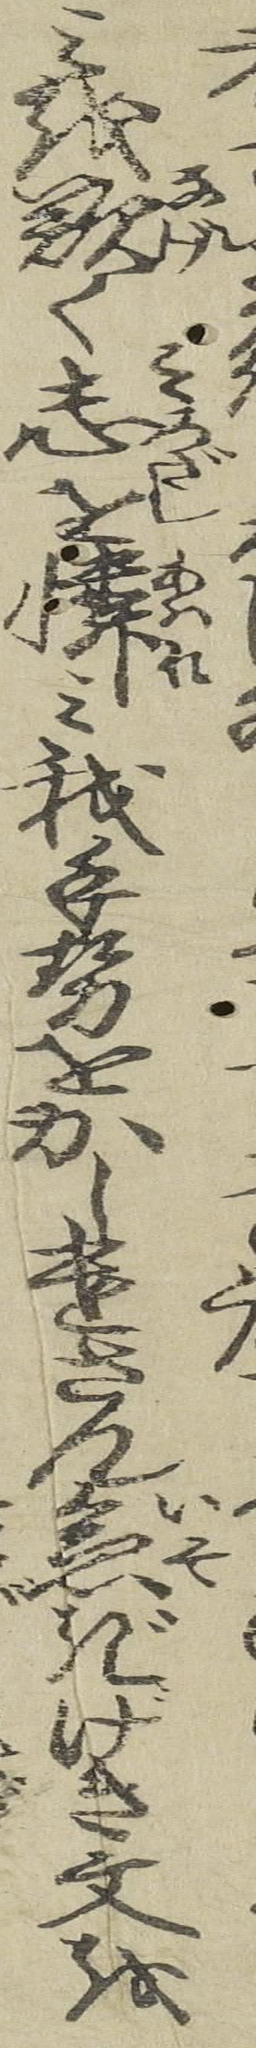身を嘆く志を憐み我手勢をかし遣さん急ぎげき文を
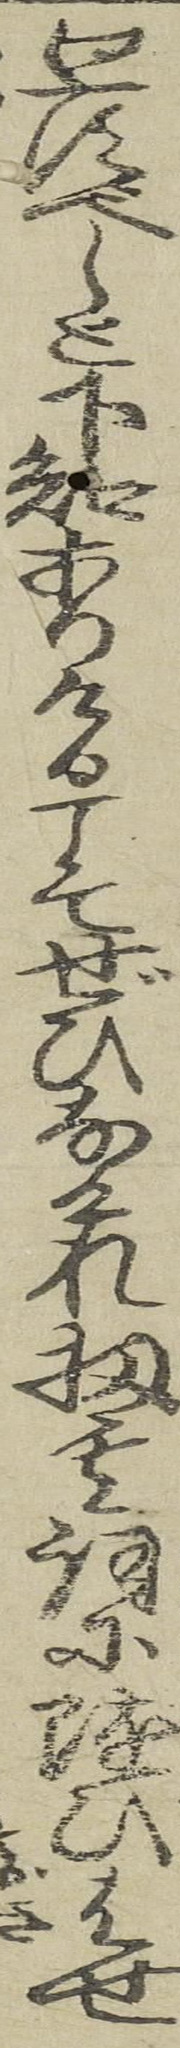廻すべしと下知ありたるにてぜひなけれ扨其詞に随ひはせ
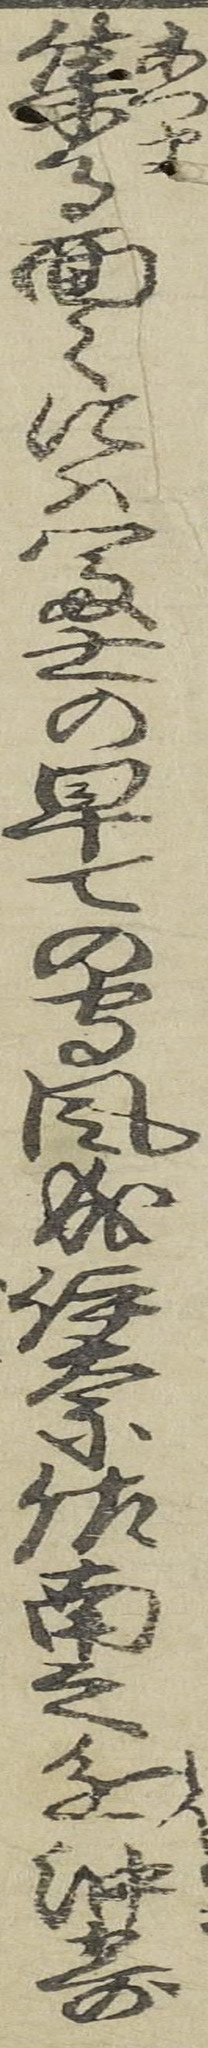集る面々には冨士の早ての守風成伊奈佐南之進沖寄
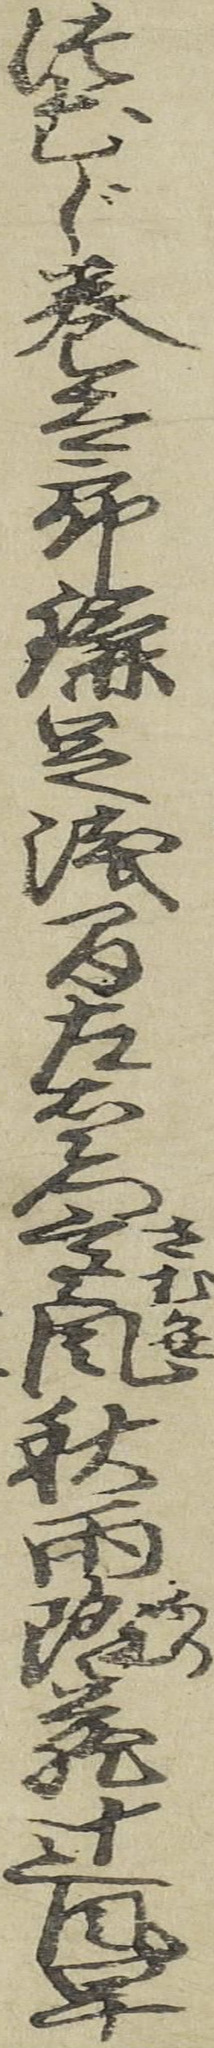つむじ巻太郎鎌足浅間左右衛門寒風秋雨降蔵辻風早
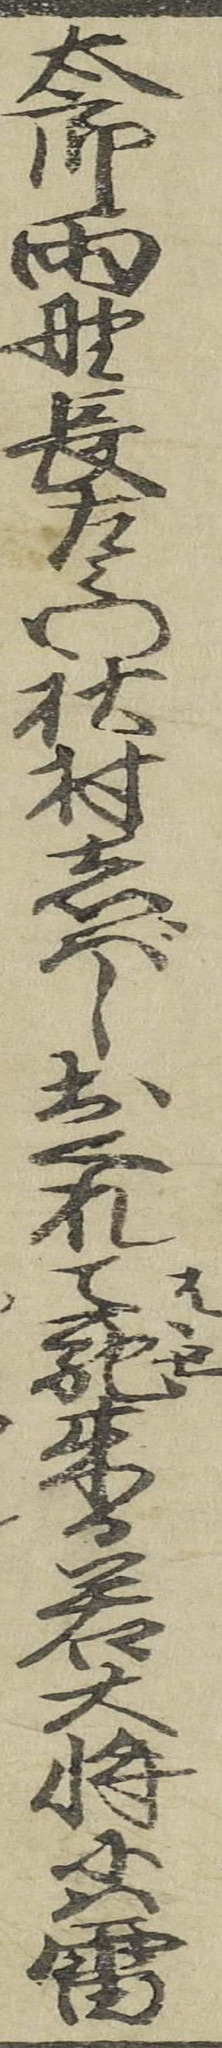太郎雨野長左衛門秋村しばしおくれて馳来る若大将には雷
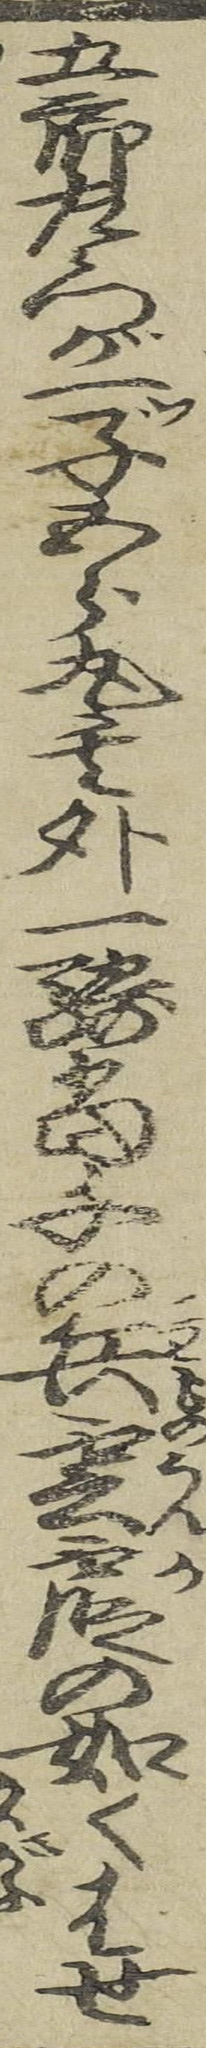五郎左衛門が一ッ子五郎丸其外一騎当千の兵雲霞のの如くはせ
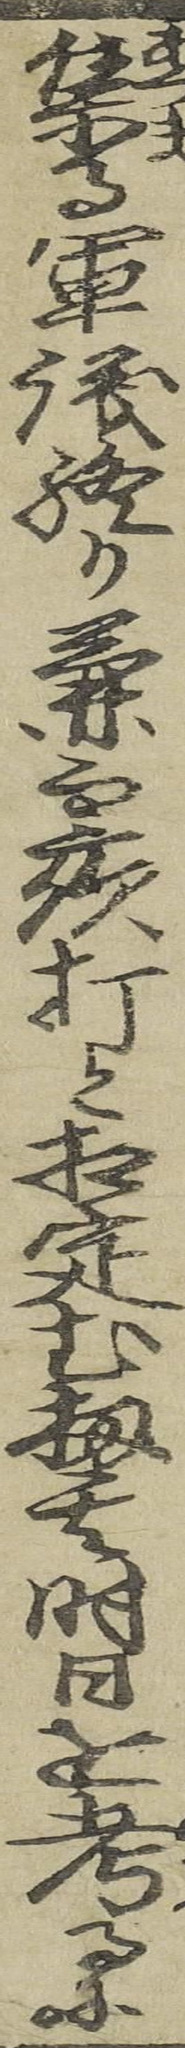集る軍議練り兼而夜打と相定む扨其明日を考るに
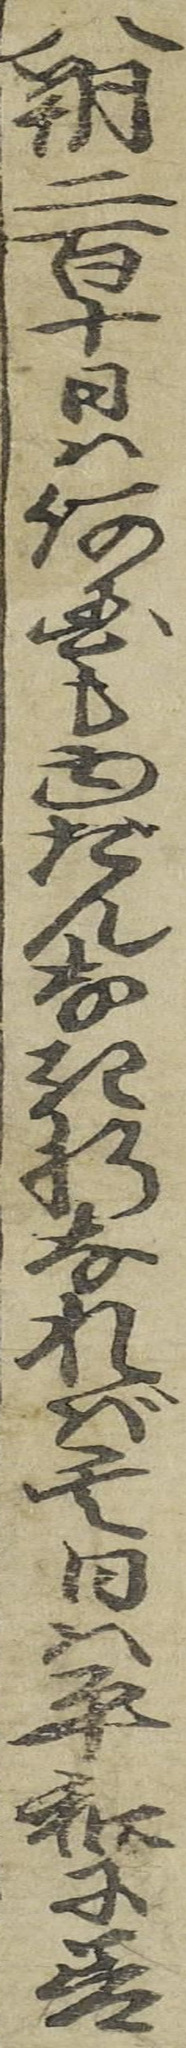八朔二百十日は何国もゆだんなき折なれば其日は平和に暮

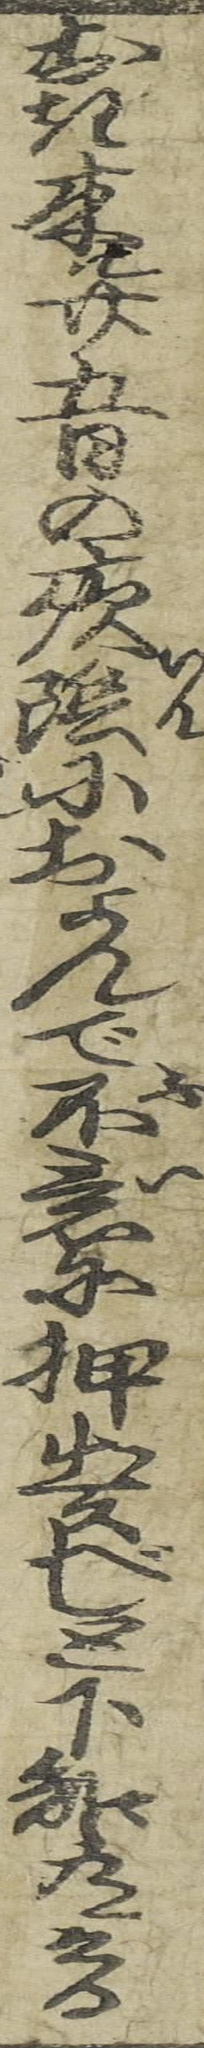おき来る廿五日の夜陰におよんで不意に押出すべしと下知及ける
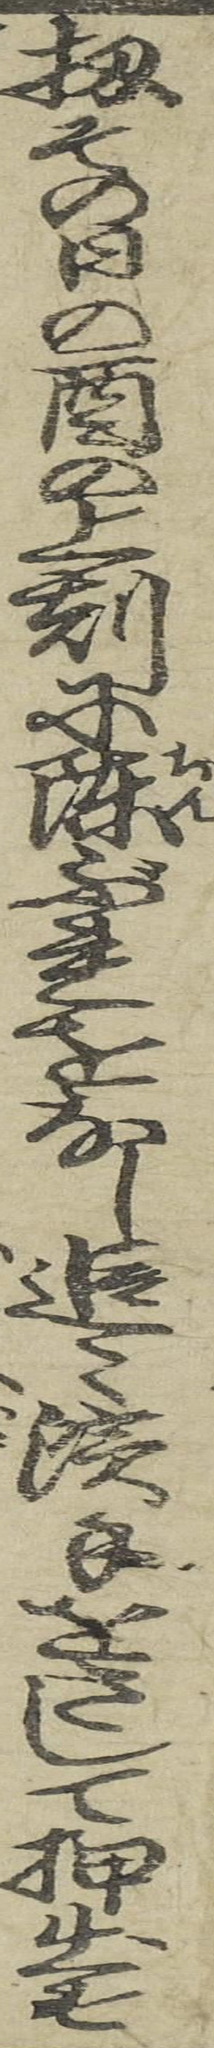扨その日の酉の上刻に陣ぶれをなし追々浜手をさして押出す
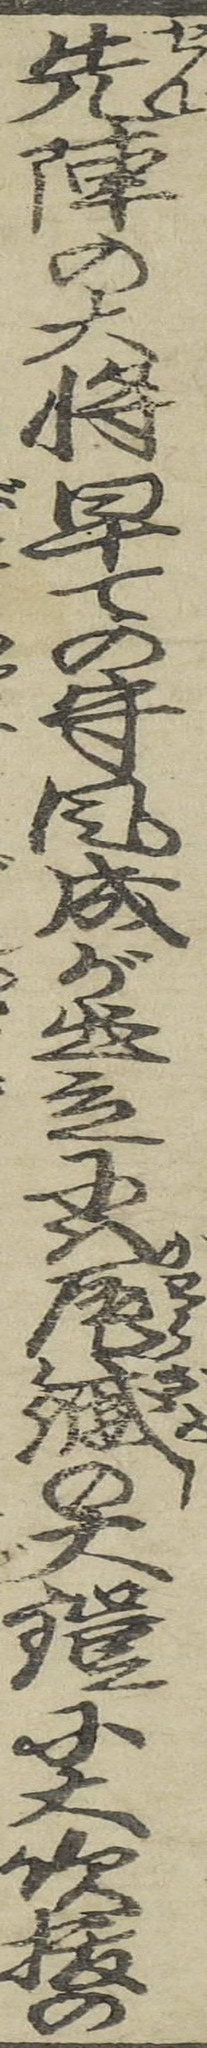先陣の大将早ての守風成が出立には瓦縅の大鎧に大炊援の
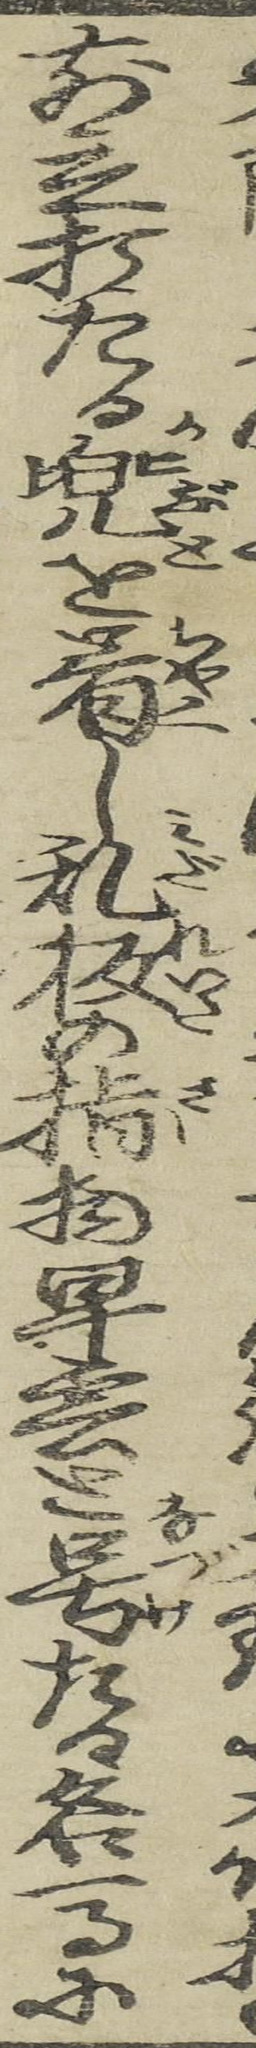前立打たる兜を着し乱板の指物早雲と号たる名馬に
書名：安政大地震畧記　全
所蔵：東京大学地震研究所図書室 Earthquake Research Institute Library, The University of Tokyo, JAPAN
